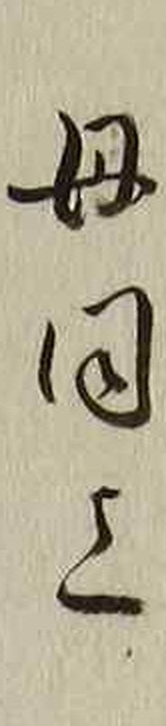母同上
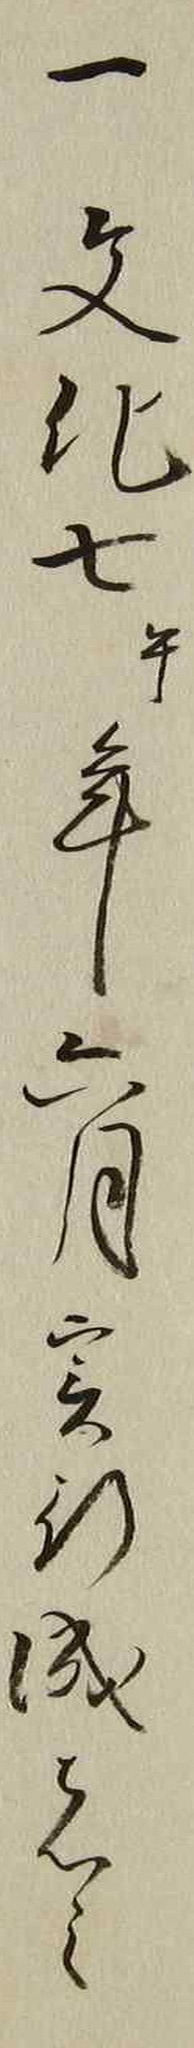一文化七午年六月実行成者之
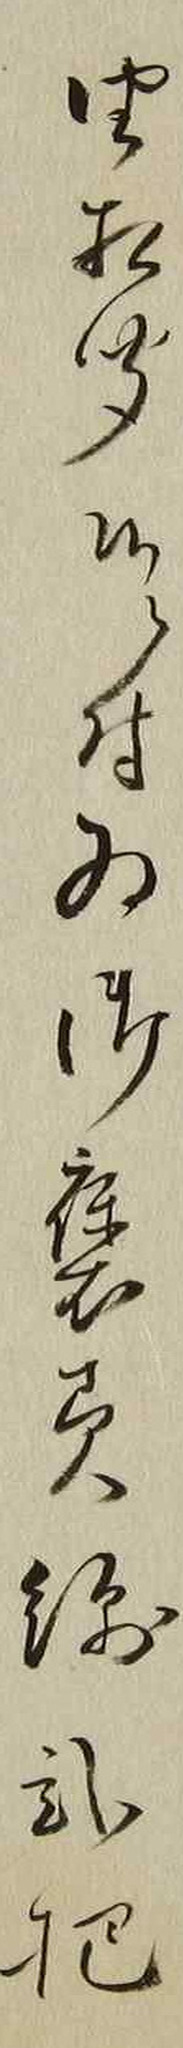由相聞候に付為御褒美綿二把
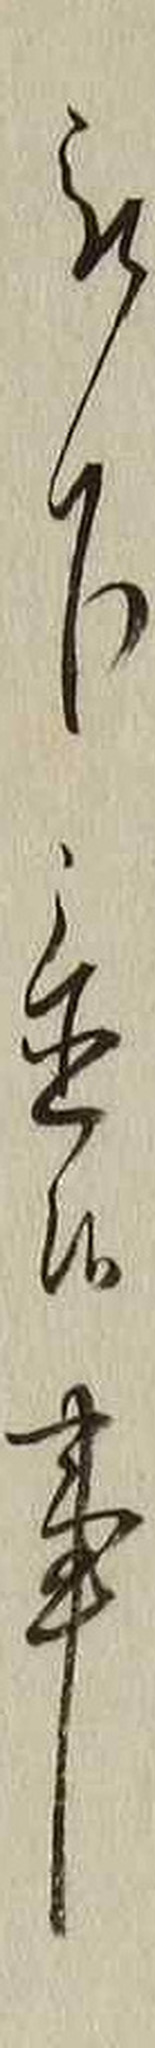被下置候事
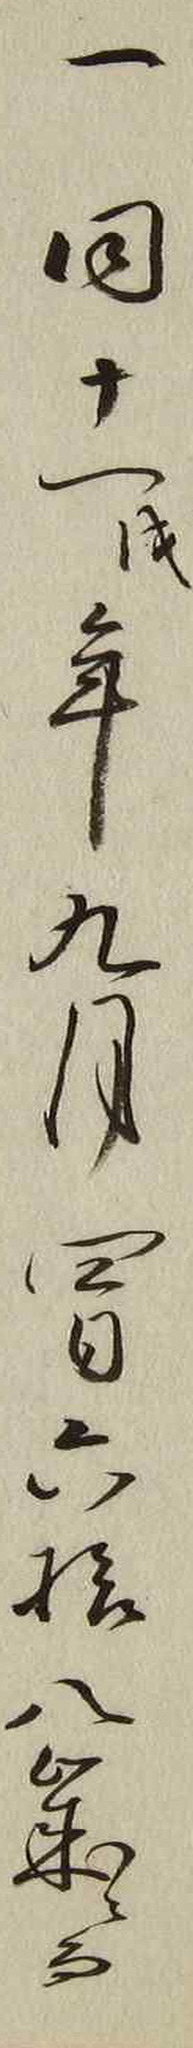一同十一戌度九月四日六拾八歳に而
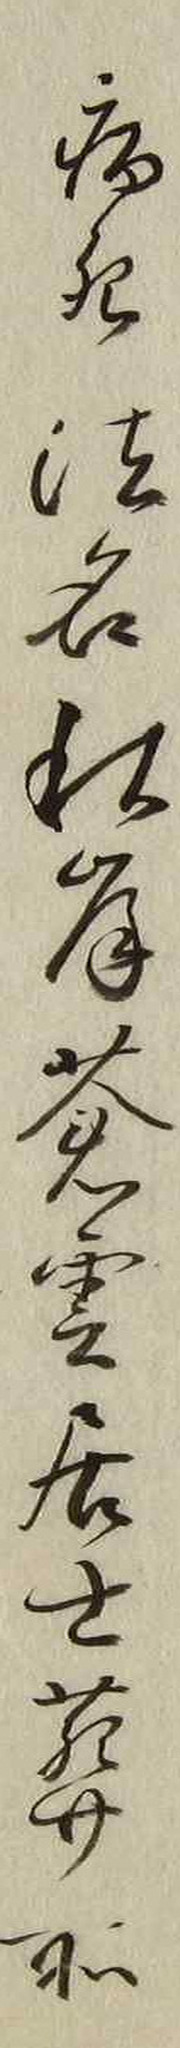病死法名秋岸蒼雲居士葬所
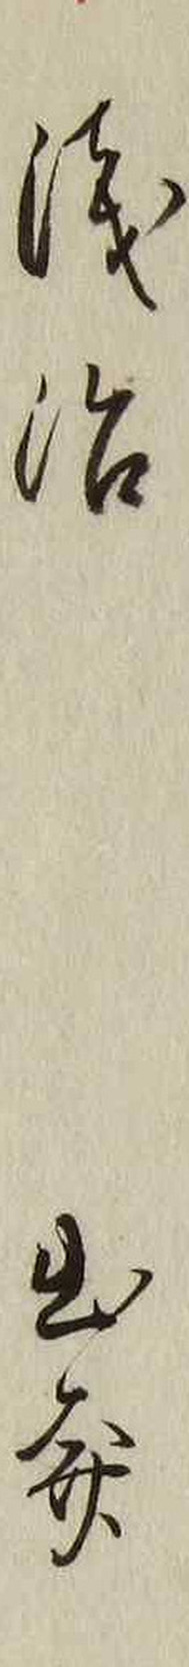浅治出奔
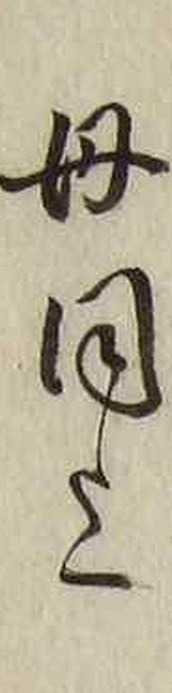母同上

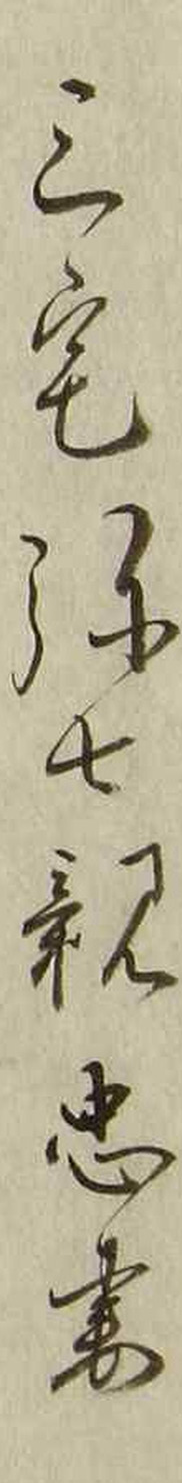女三宅孫七親忠妻
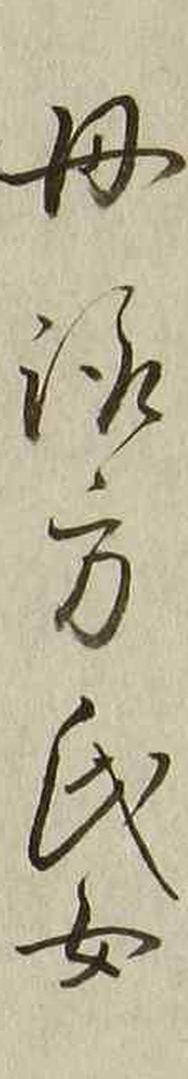母諏方氏女
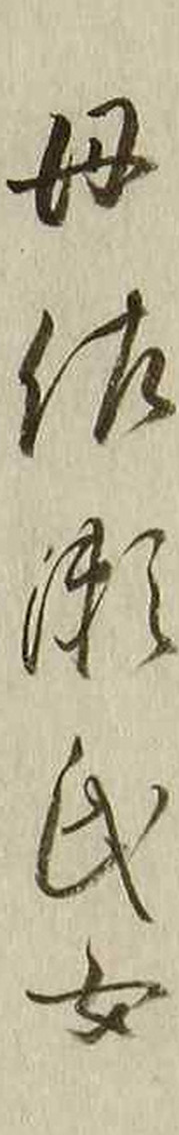母佐瀬氏女
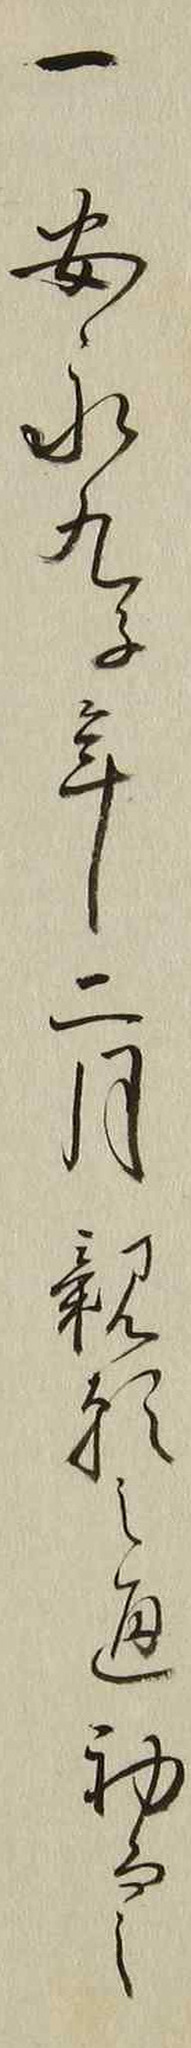一安永九子年二月親願之通初而之
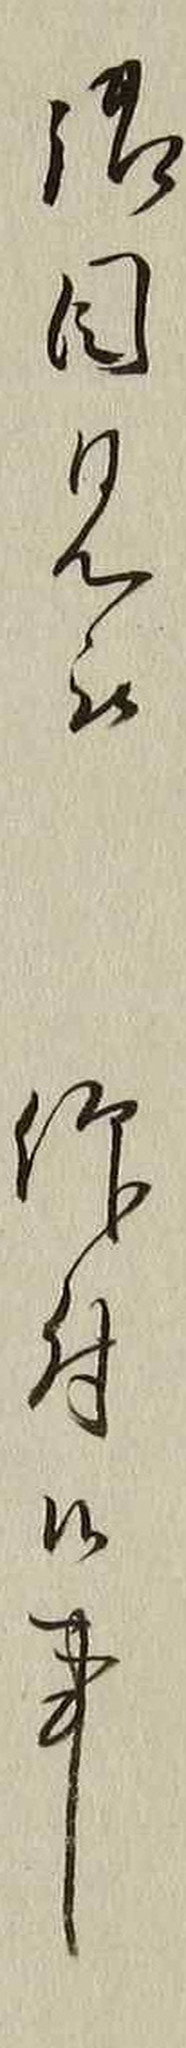御目見被仰付候事
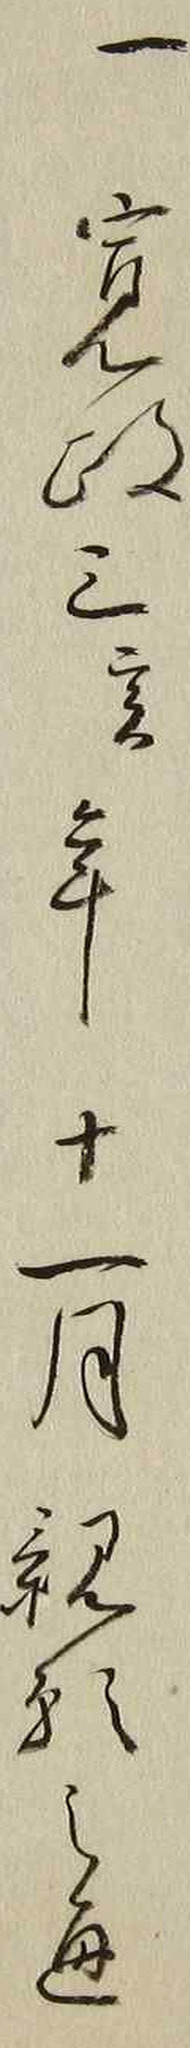一寛政三亥年十一月親願之通
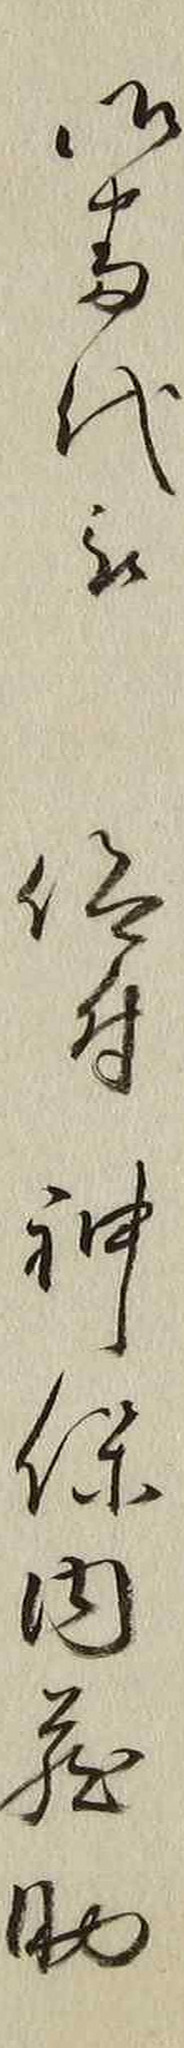御番代被仰付神保内蔵助
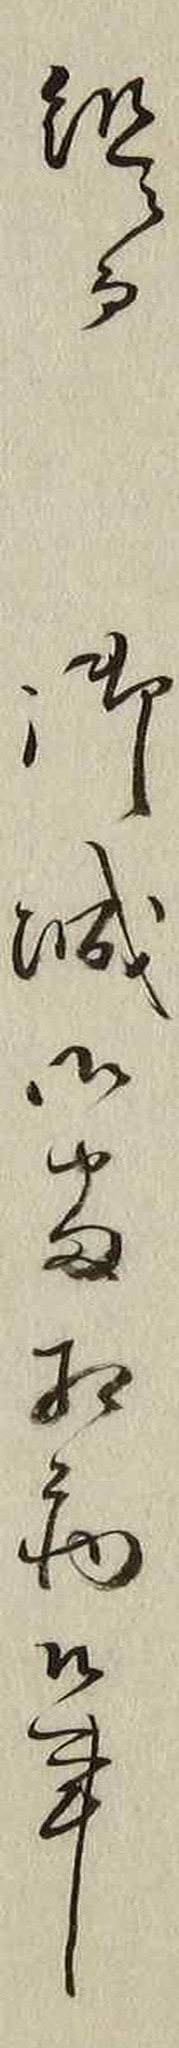組に而御城御番相勤候事
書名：諸士系譜　巻之6　い之部6
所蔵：会津若松市立会津図書館
